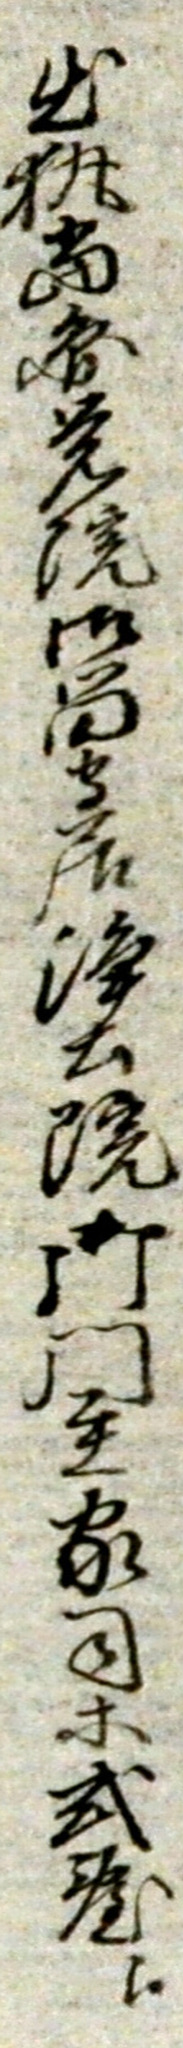出執當圓覚院御留守居浄土院御門主家司等式臺江
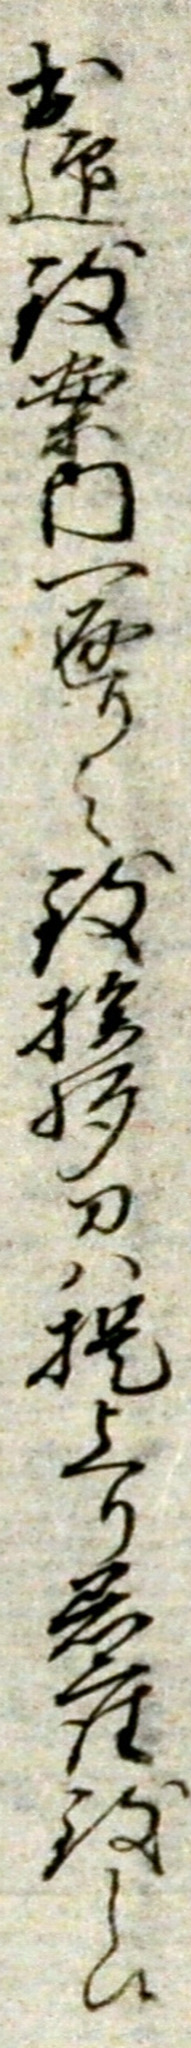出迎致案内一通り之致挨拶刀ハ提上り着座致し候
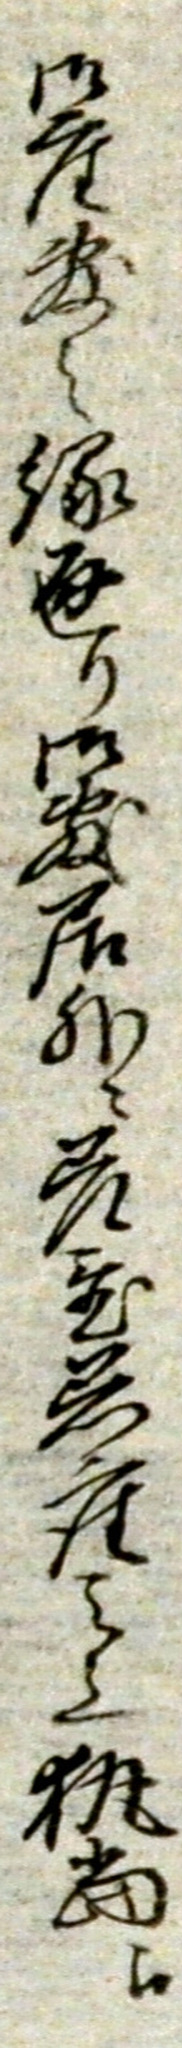御座敷之縁通ㇼ御敷居外ニ差置着座之上執當江
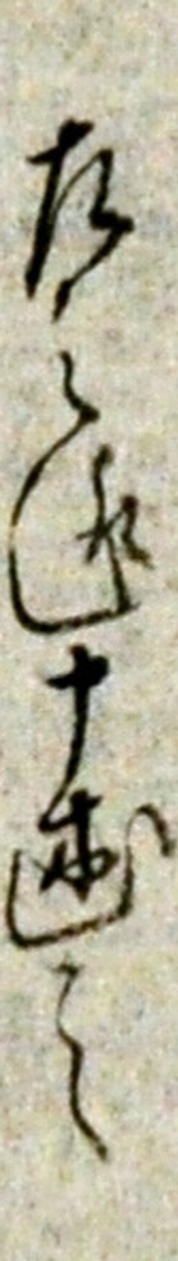左之趣申述之
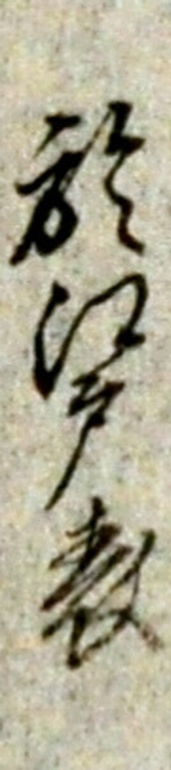於江戸表
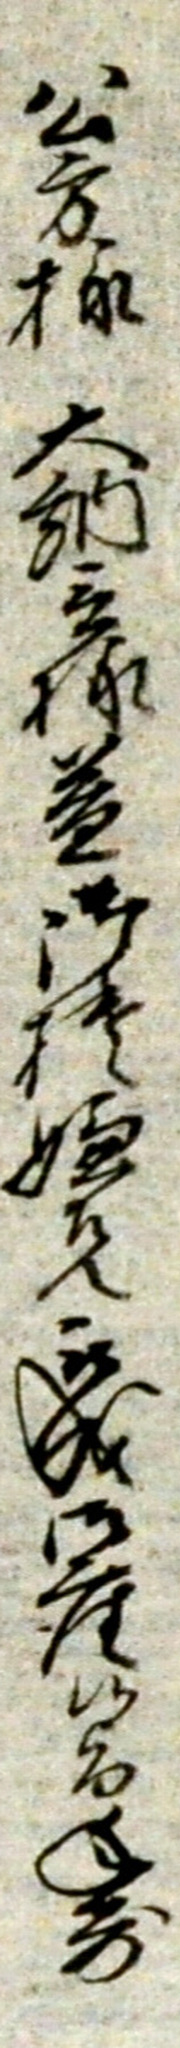公方様大納言様益御機嫌克被成御座候旨年寄
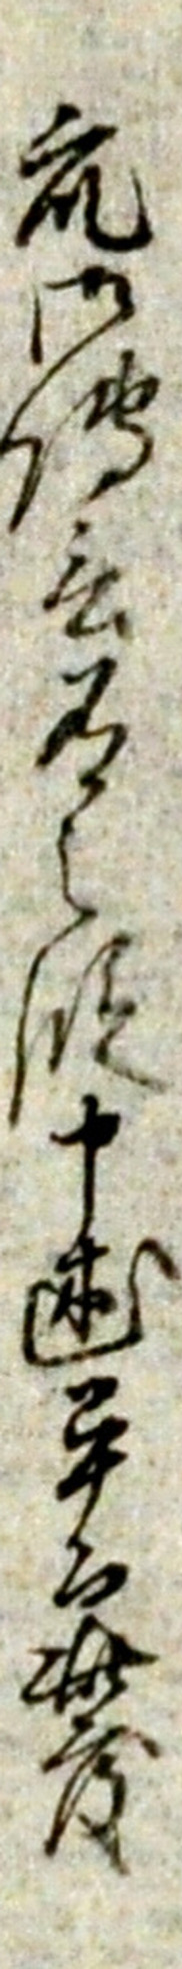衆御傳言有之段申述畢而此度
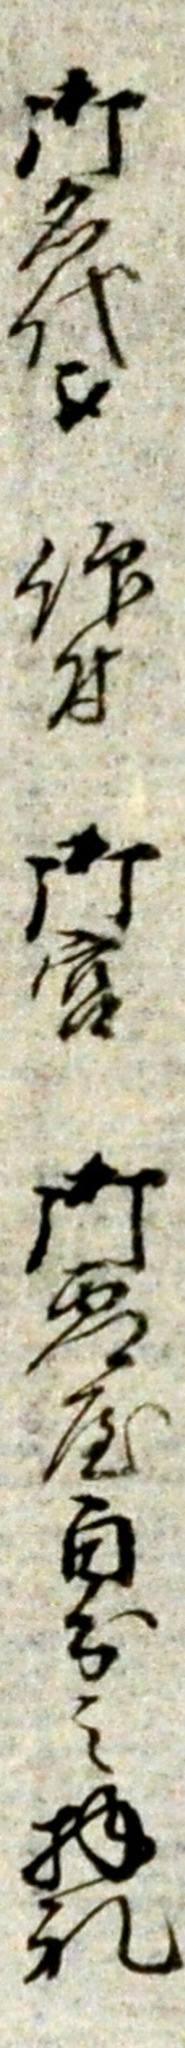御名代被仰付御宮御霊屋自分之拝礼
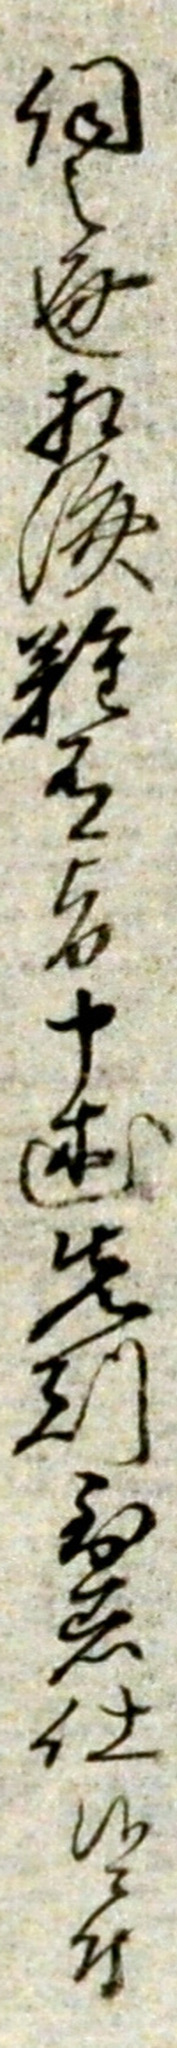伺之通相済難有旨申述先刻到着仕候ニ付
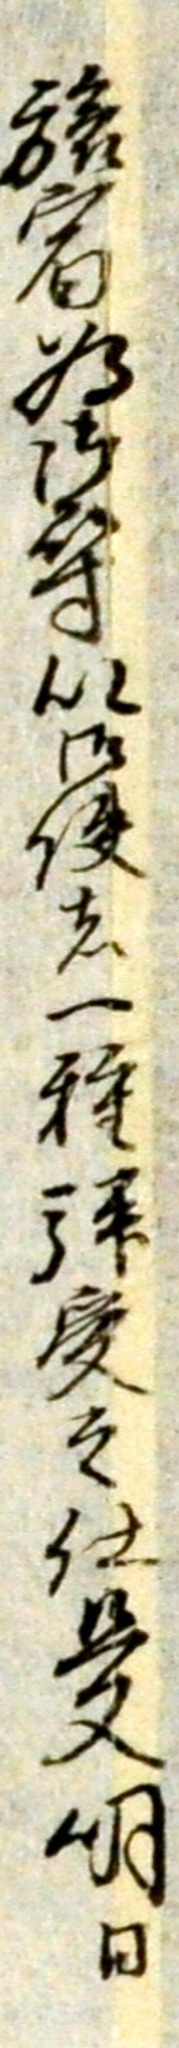旅宿為御尋以御使者一種拝受之仕且又明日
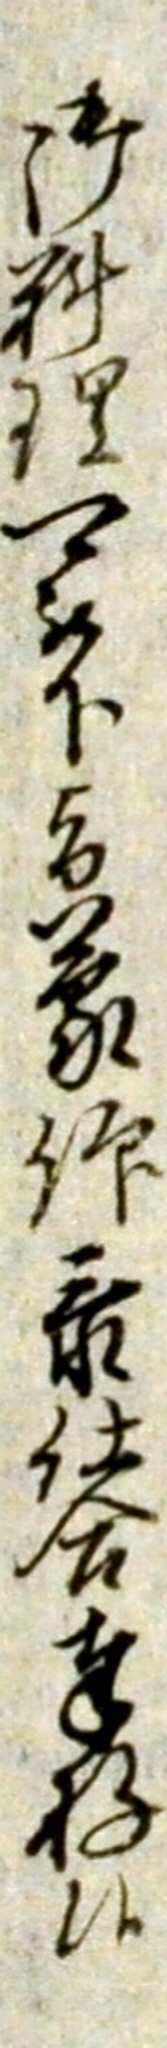御料理可被下旨蒙仰忝仕合奉存候
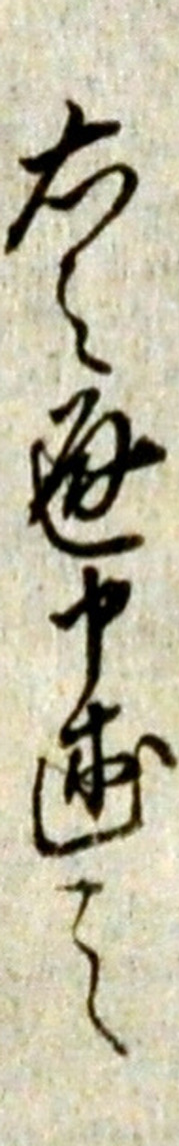右之通申述之
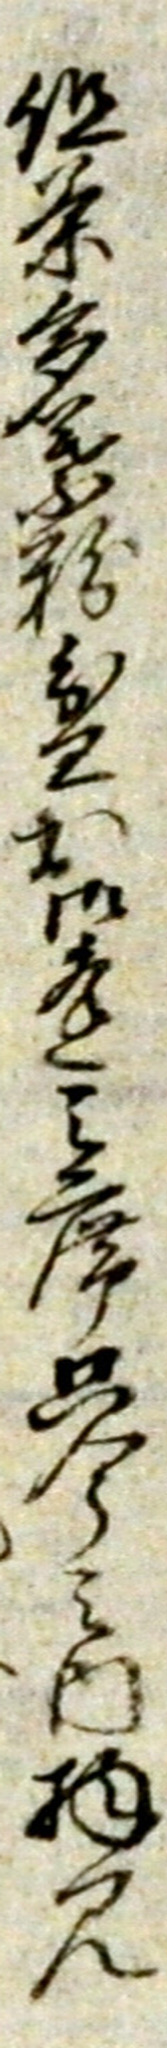但茶多葉粉盆於御逢之席只今之内拝見
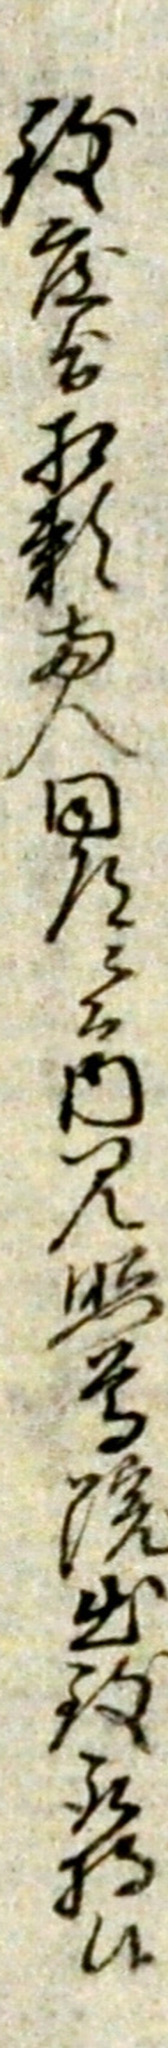致度旨相頼両人同道ニ而内見照尊院出致取持候
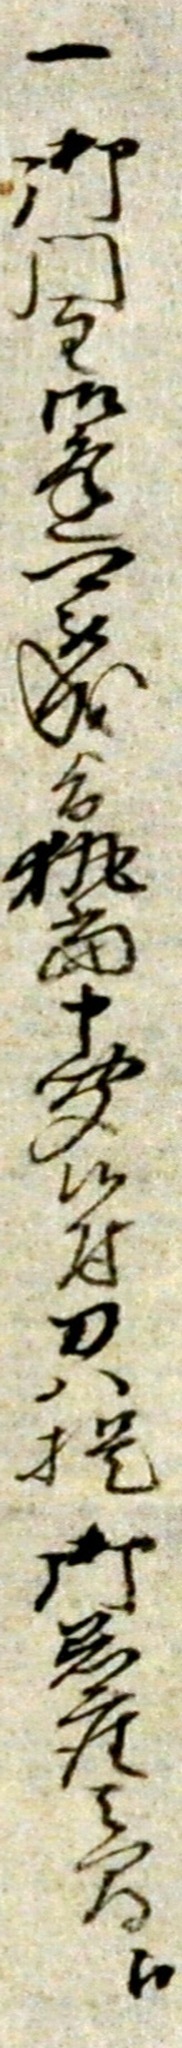一御門主御逢可被成旨執当申聞候付刀ハ提御着座之間江
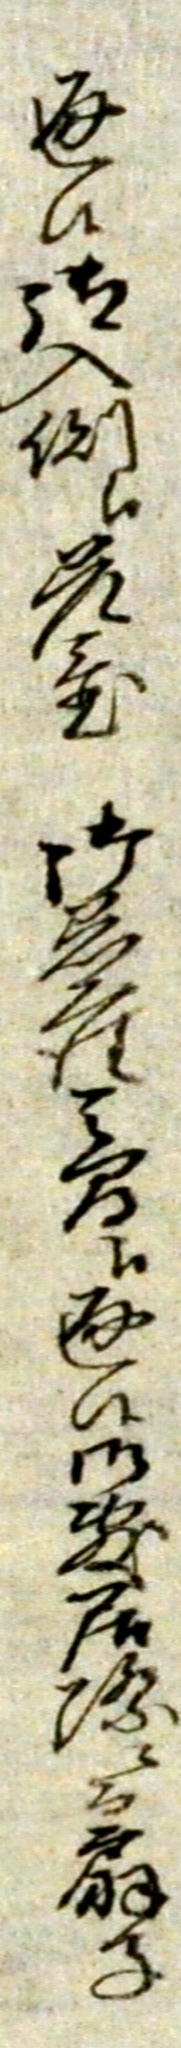通候御入側江差置御着座之間江通候御敷居際ニ而扇子
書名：日光御名代相勤候節ノ留
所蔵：伊那市立高遠町図書館・合同会社AMANE
